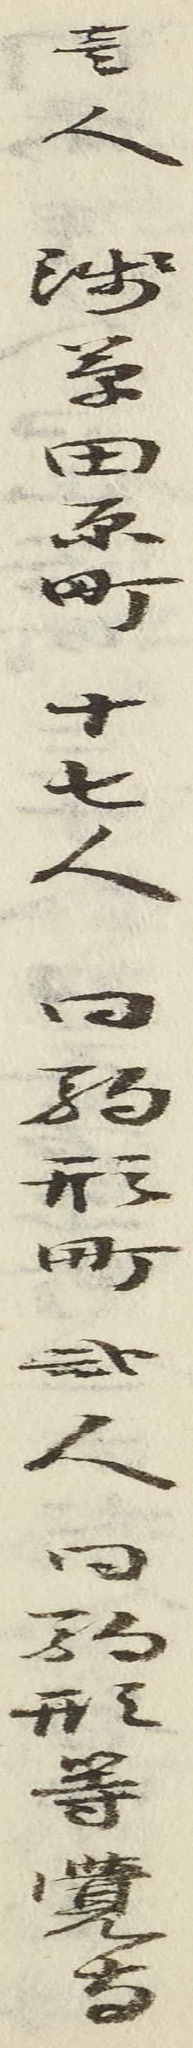壱人浅草田原町十七人同駒形町弐人同駒形等覚寺
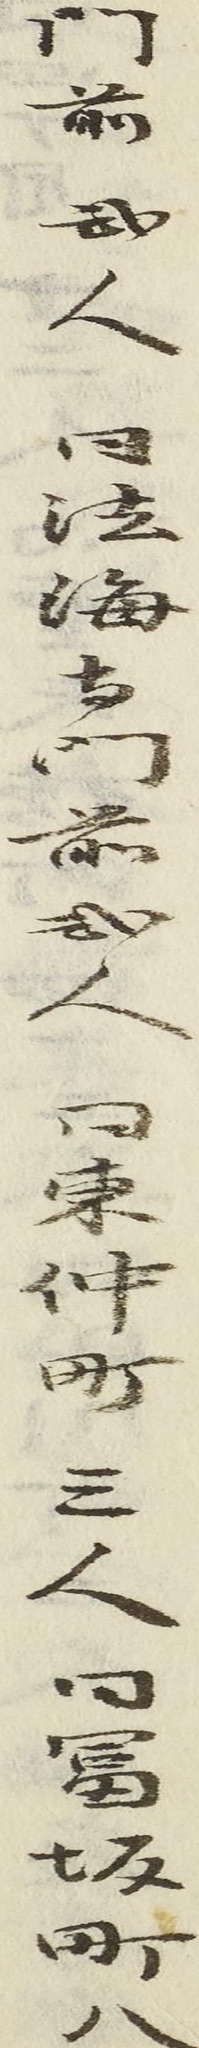門前弐人同法海寺門前弐人同東仲町三人同富坂町八
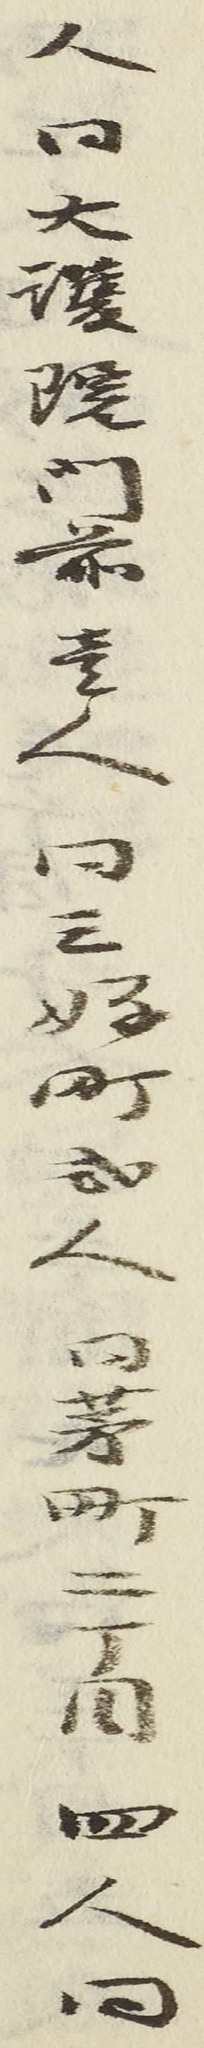人同大護院門前壱人同三好町弐人同茅町二丁目四人同
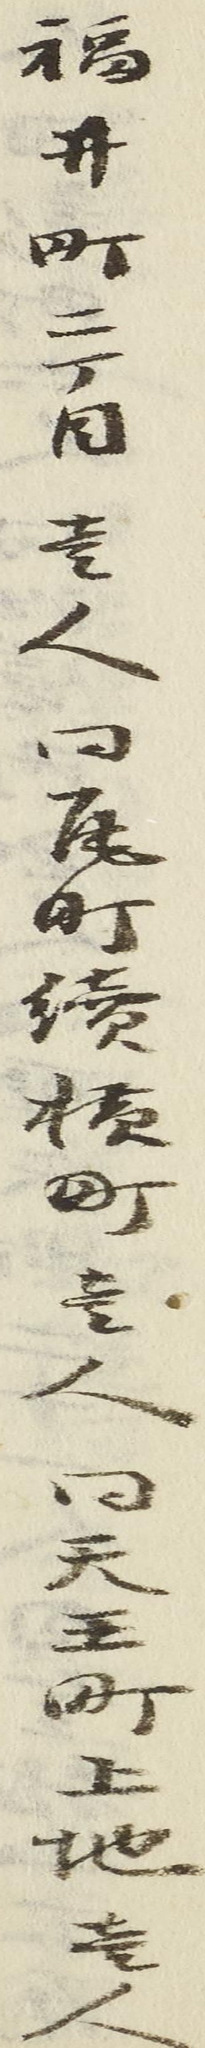福井町二丁目壱人同瓦町続横町壱人同天王寺上地壱人
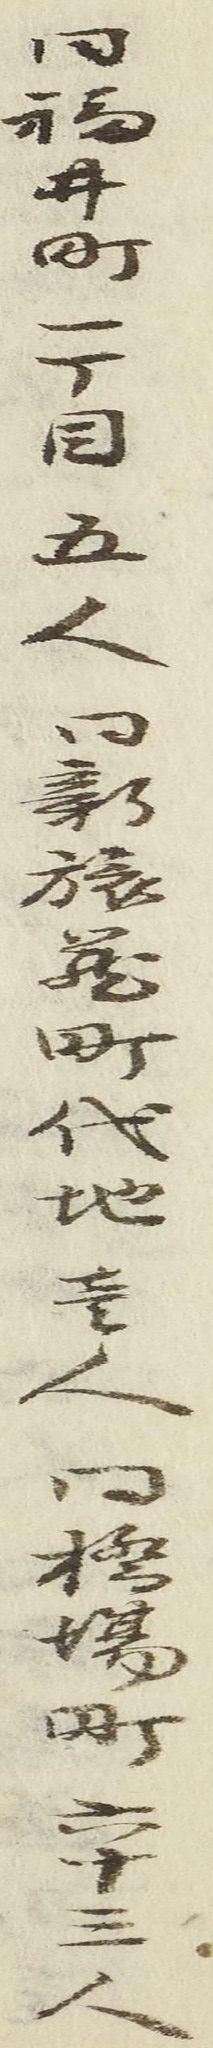同福井町二丁目五人同新旅籠町代地壱人同橋場町六十三人
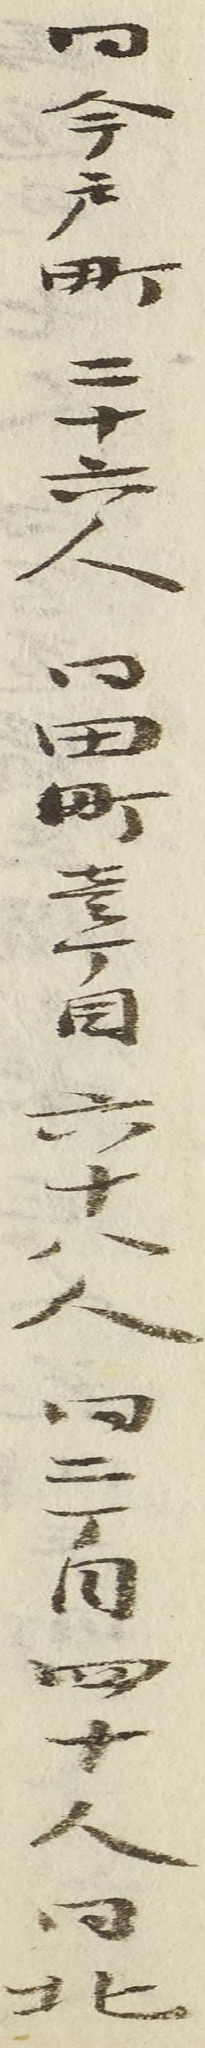同今戸町二十六人同田町壱丁目六十八人同二丁目四十八人同北

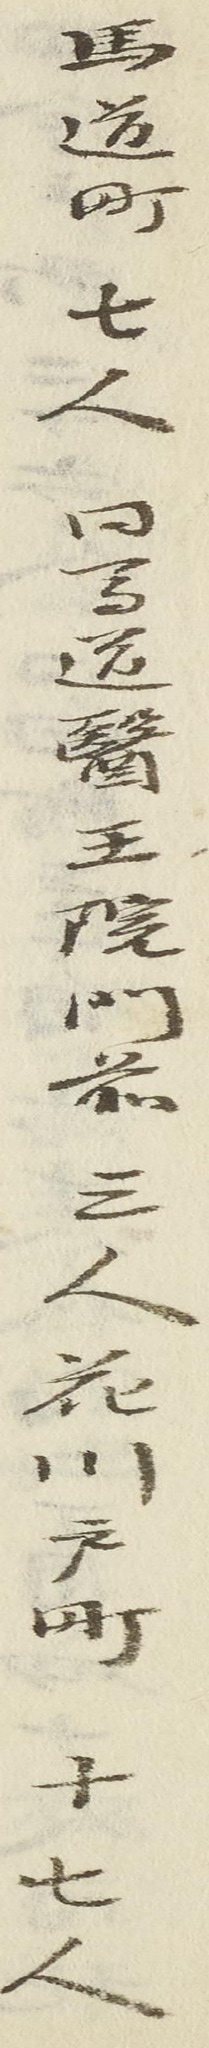馬道七人同馬道医王院門前三人花川戸町十七人
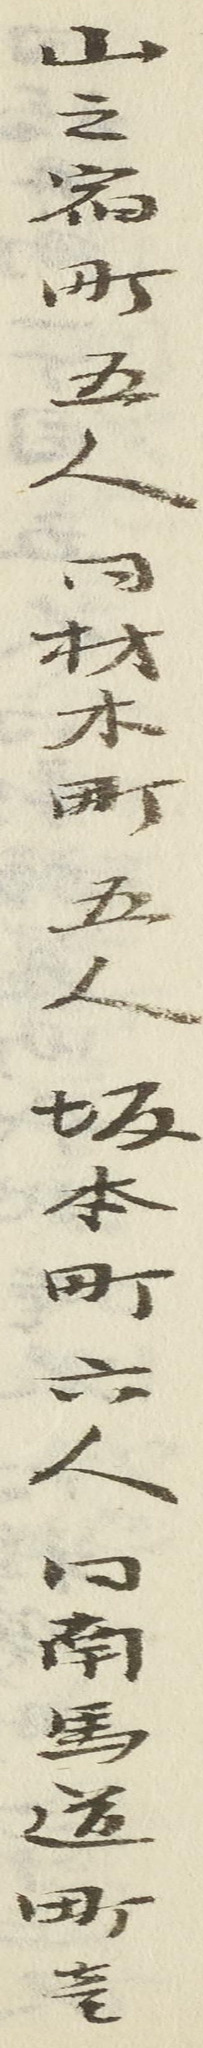山之宿町五人同材木町五人坂本町六人同南馬道町壱
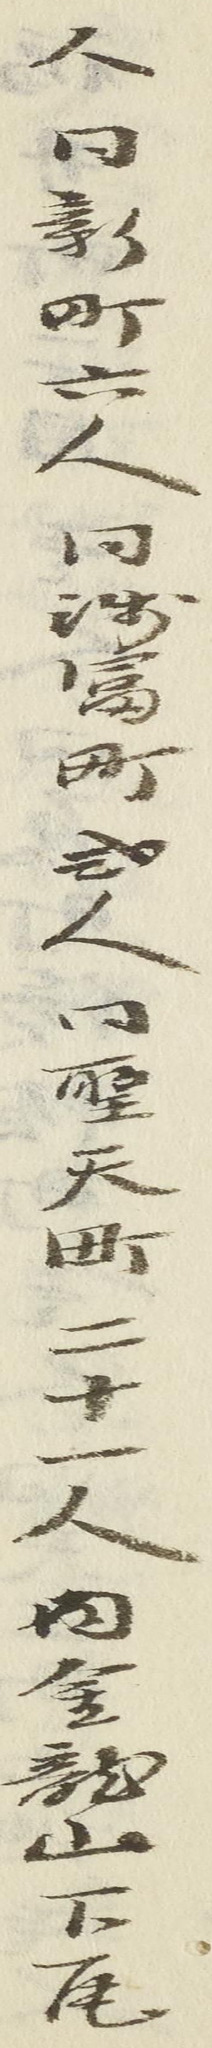人同新町六人同浅冨町弐人同聖天町二十一人同金龍山下瓦
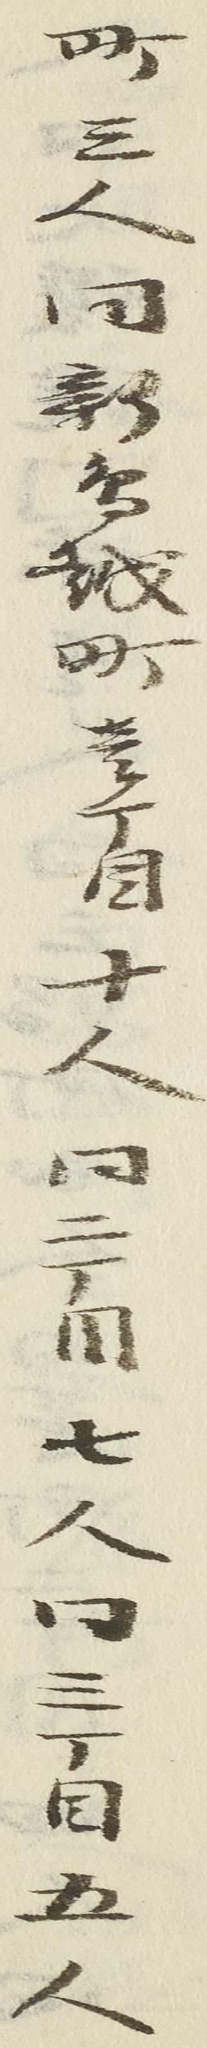町三人同新鳥越町壱丁目十人同二丁目七人同三丁目五人
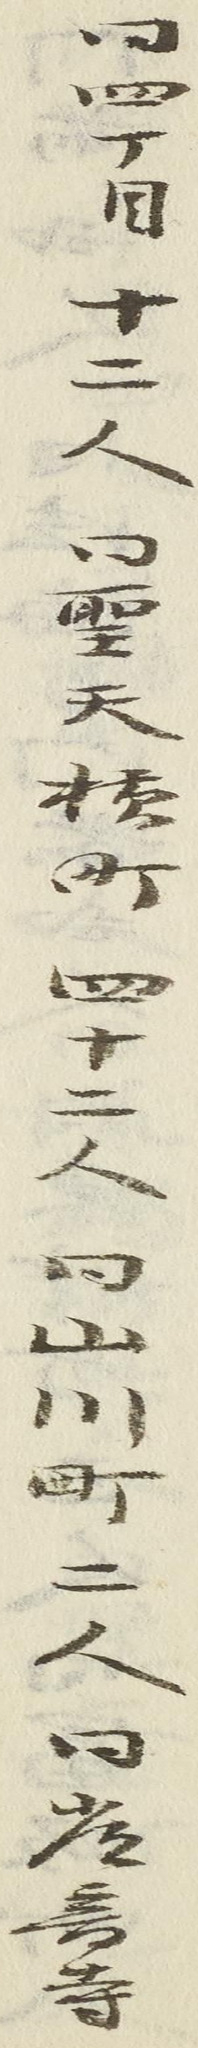同四丁目十二人同聖天横町四十二人同山川町二人同常音寺
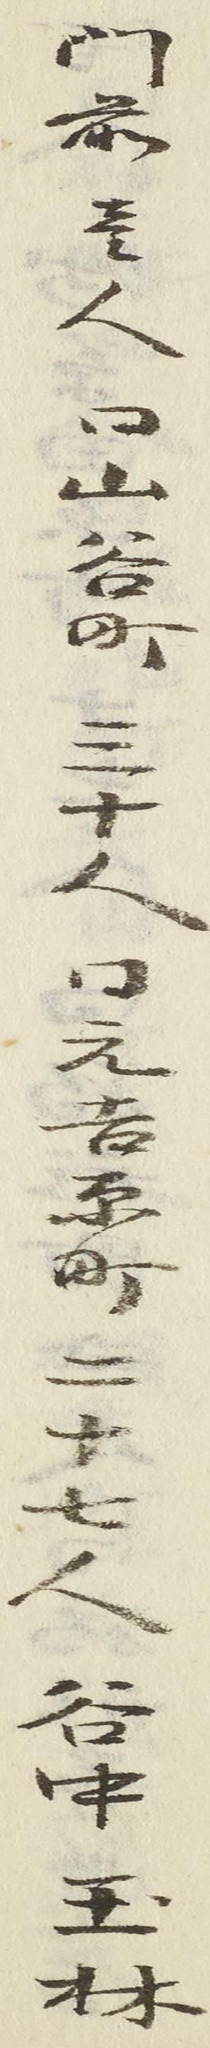門前壱人同山谷町三十人同元吉原町二十七人谷中玉林
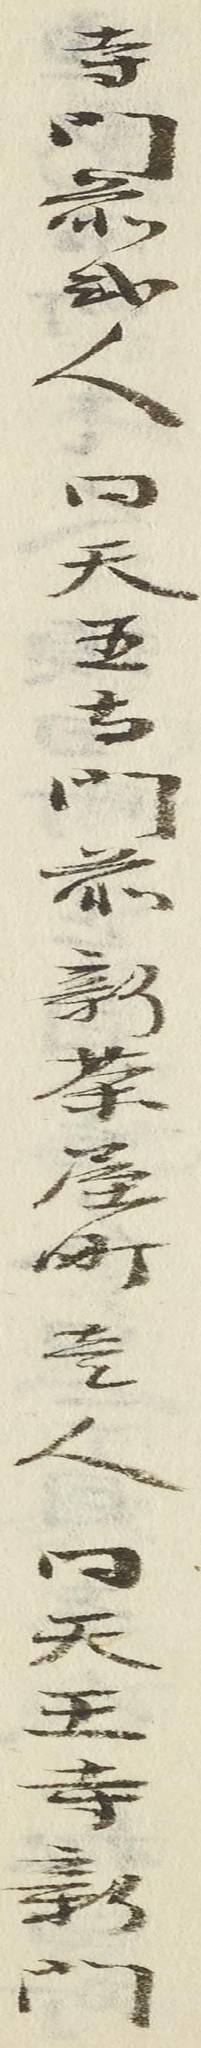寺門前弐人同天王寺門前新茶屋町壱人同天王寺新門
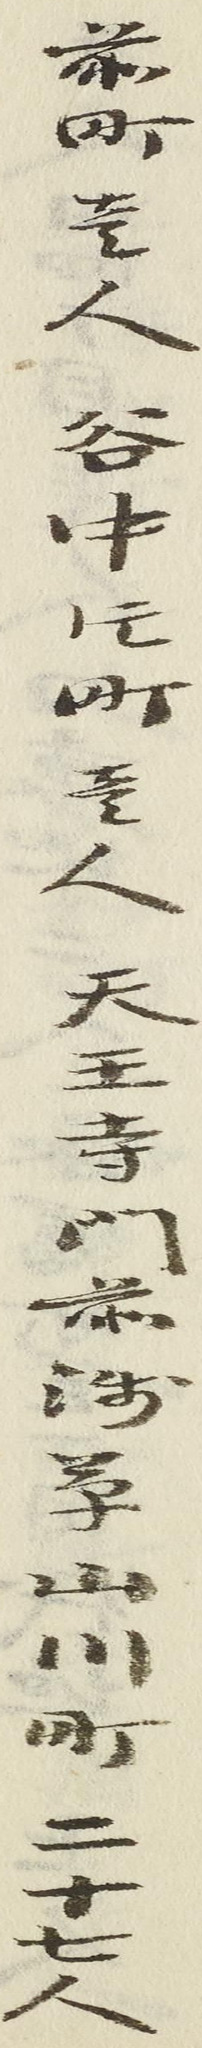前町壱人谷中片町壱人天王寺門前浅草山川町二十七人
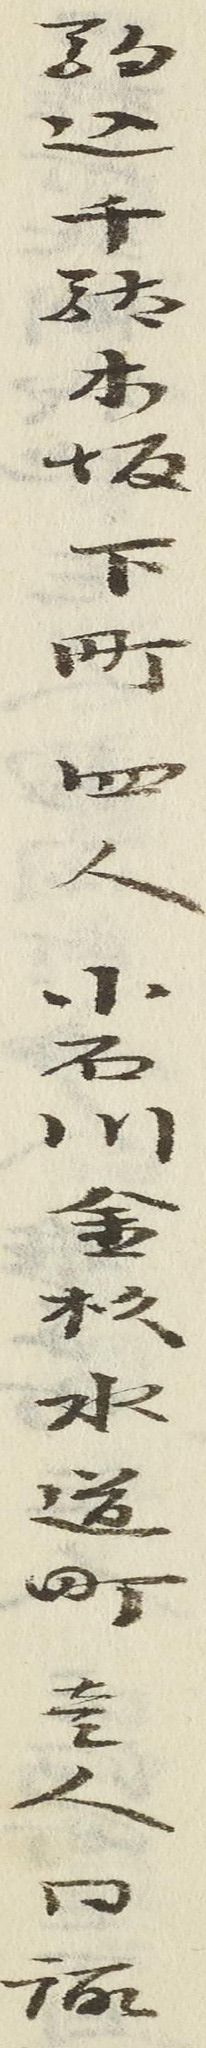駒込千駄木坂下町四人小石川金杉水道町壱人同諏
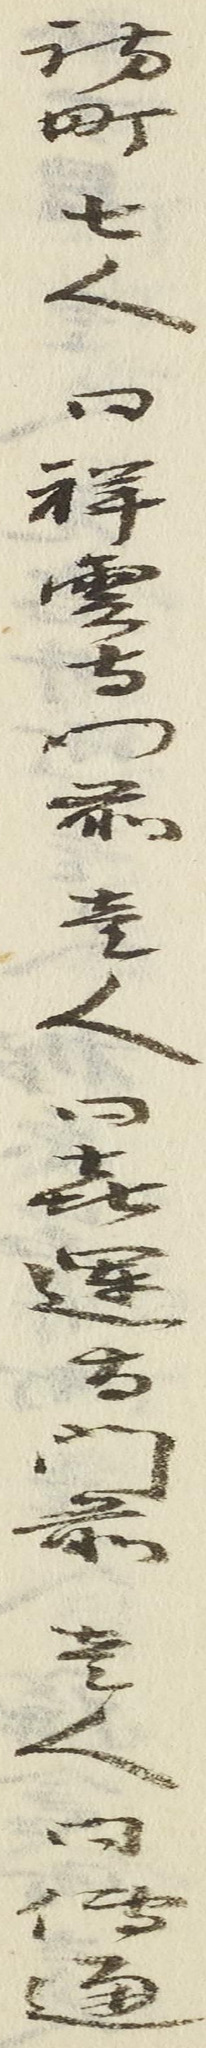訪町七人同祥雲寺門前壱人同喜運寺門前壱人同伝通
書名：那為の後見艸　全
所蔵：東京大学地震研究所図書室 Earthquake Research Institute Library, The University of Tokyo, JAPAN
